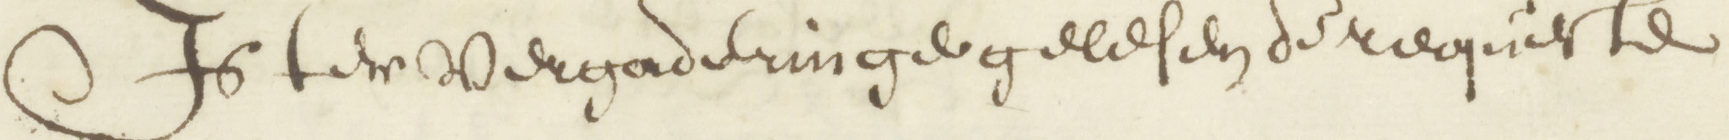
Is ter vergaderinge gelesen de requeste
